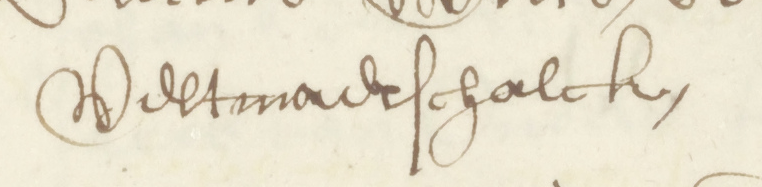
Veltmaerschalck,
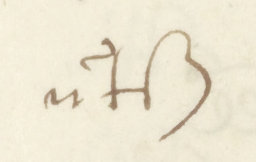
uts
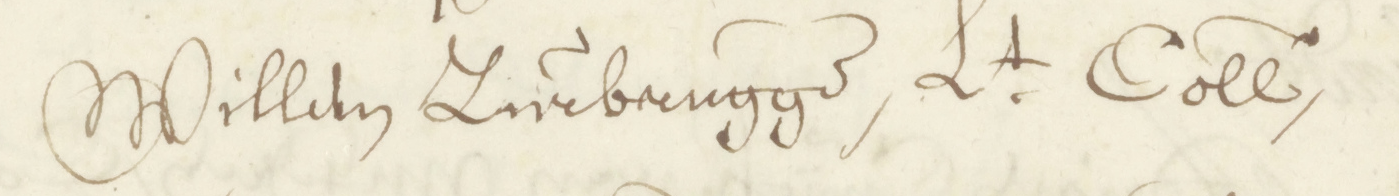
Willem Zurbrugge, Lt. Coll.
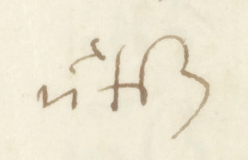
uts
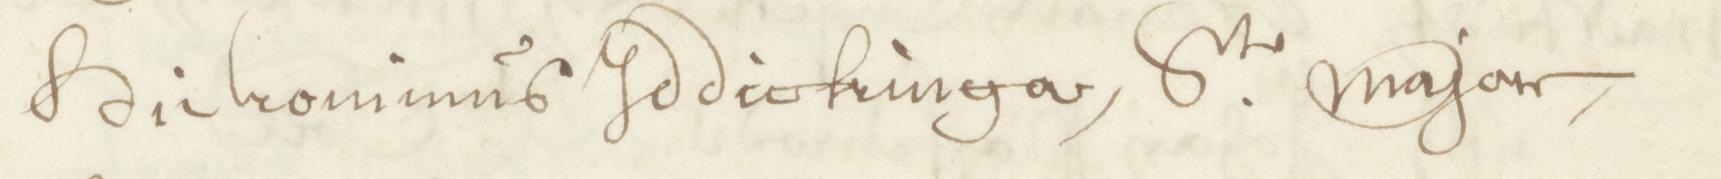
Hierominus Iddickinga, St. Major,
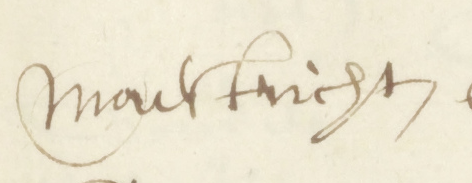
Maestricht,
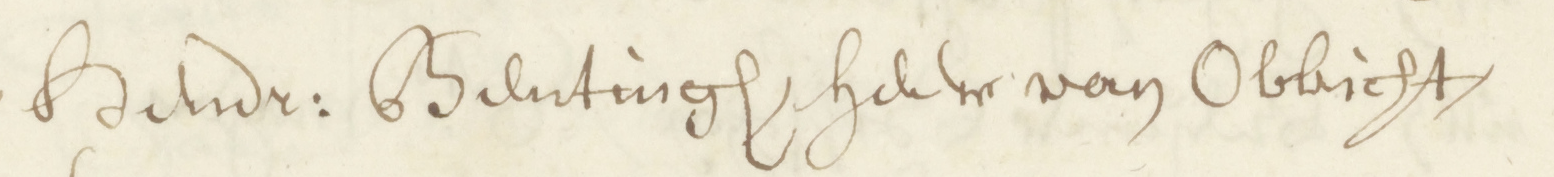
Hendr: Bentingh, heer van Obbicht,
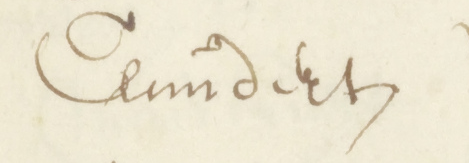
Clundert,
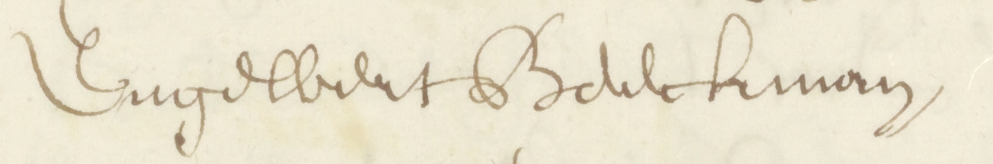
Engelbert Beeckman,
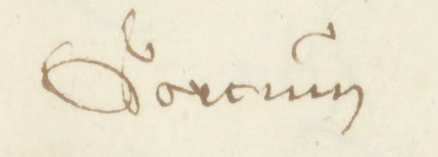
Gorcum
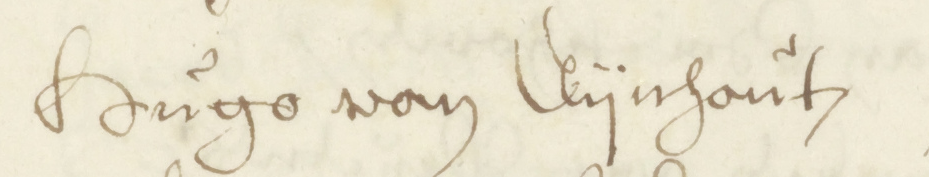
Hugo van Eijnhout,
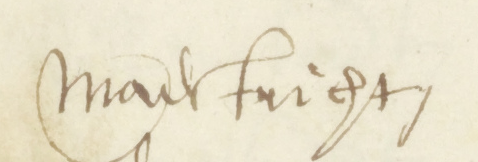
Maestricht,
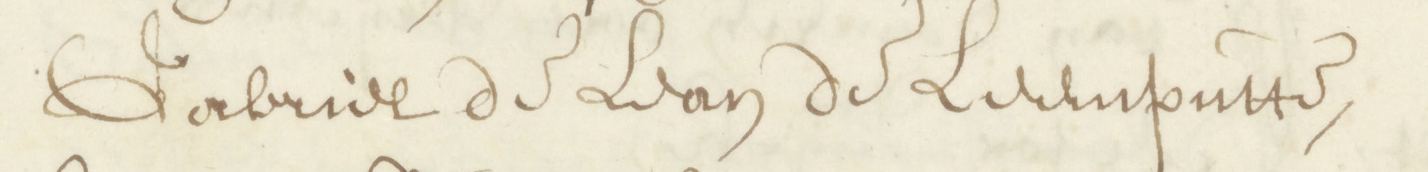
Gabriel de Lean de Leemputte,
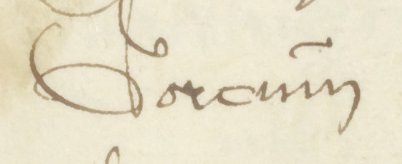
Gorcum
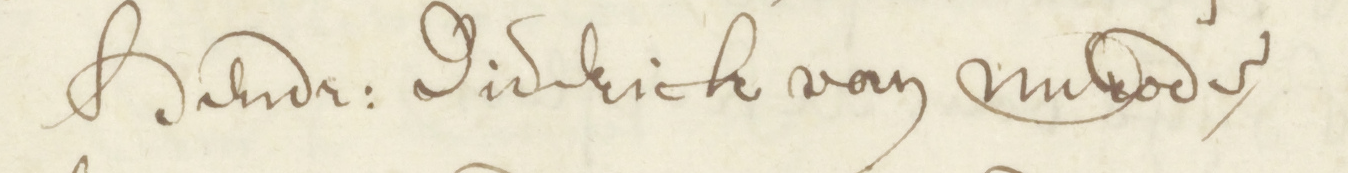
Hendr: Diderick van Merode,
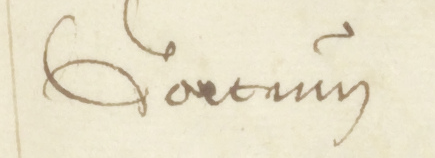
Gorcum
